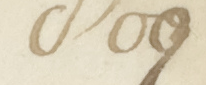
809
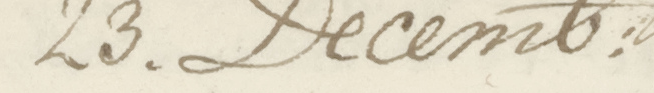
23. Decemb:
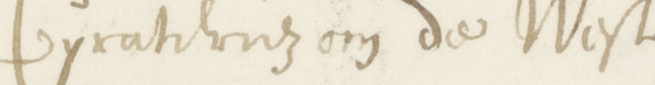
pijraterien om de West
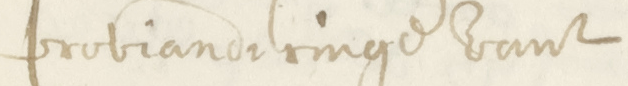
provianderinge van
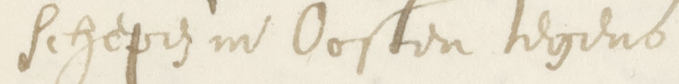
schepen in Oosten tegens
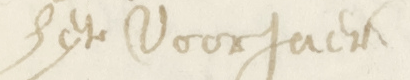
het Voorjaer
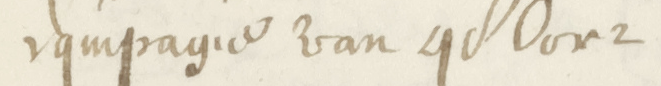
Equipagie van 48 Oor,,
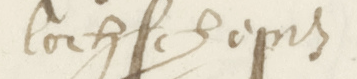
lochschepen
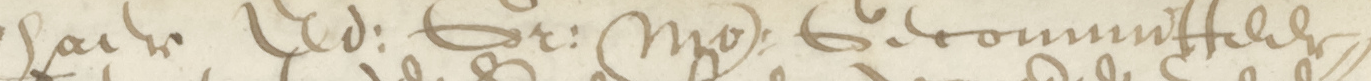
haer Ed:Gr:Mo: Gecommitteer,,
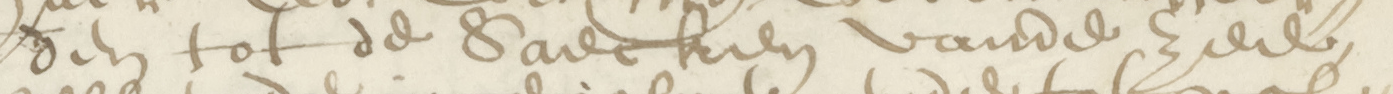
den tot de Saecken vande zee,
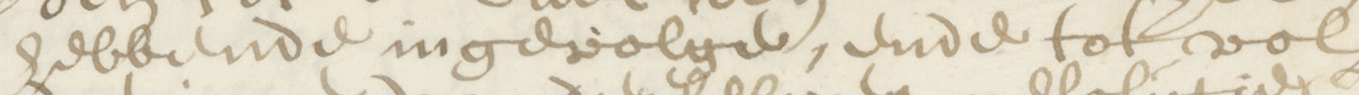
hebbende ingevolge, ende tot vol,,
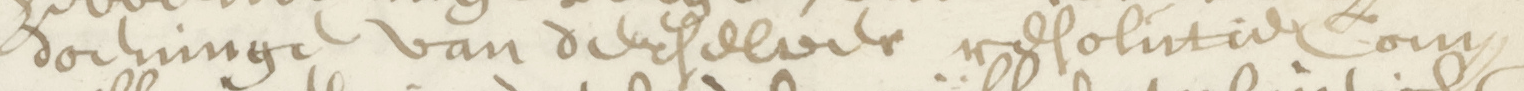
doeninge van derselver resolutie Com,,
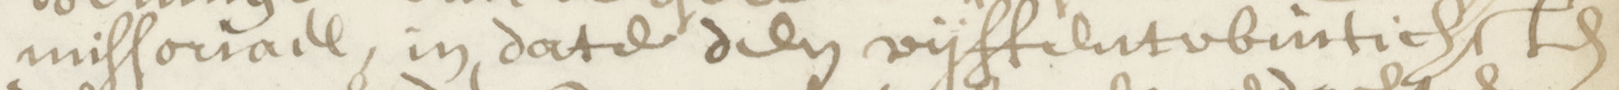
missoriael, in date den vijffentwintichsten
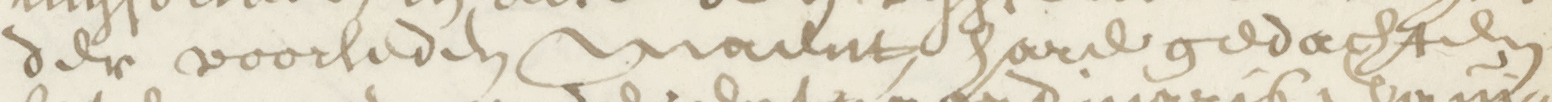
der voorleden maent, hare gedachten
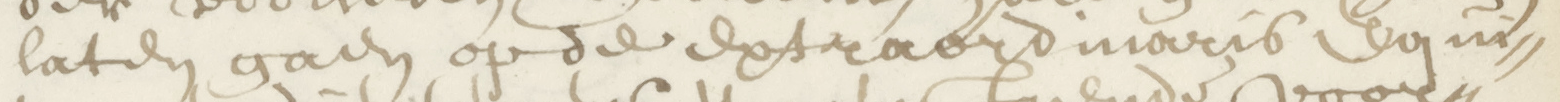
laten gaen op de extraordinaris Equi,,
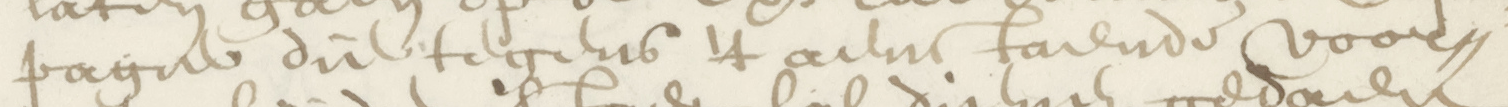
pagie die tegens 't aenstaende voor,,
